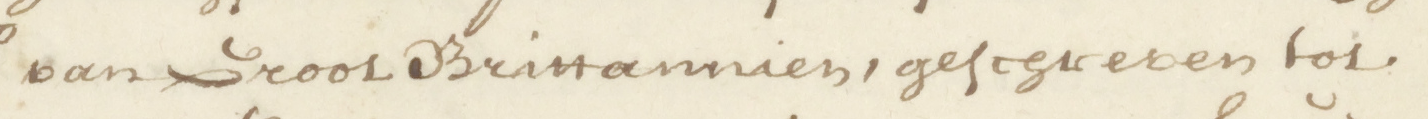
van Groot Brittannien, geschreven tot
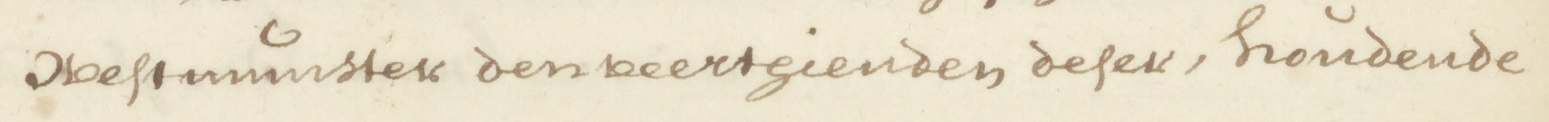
westmunster den veerthienden deser, houdende
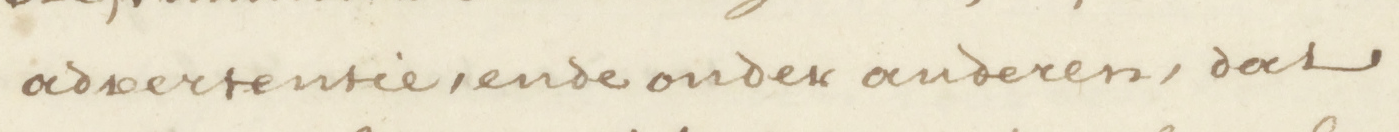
advertentie, ende onder anderen, dat
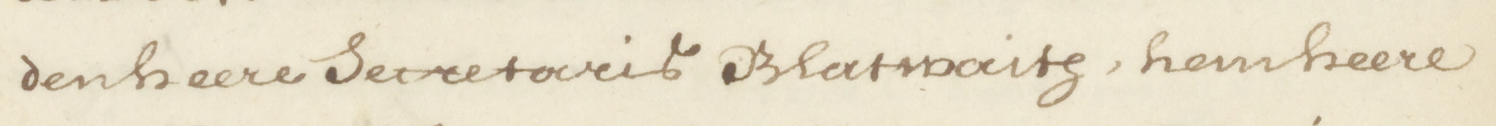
den heere secretaris Blatwaith, hem heere
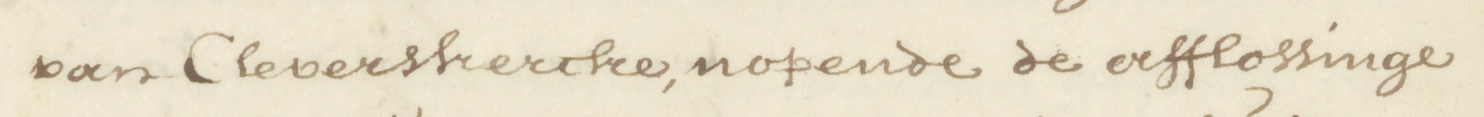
van Cleverskercke, nopende de afflossinge
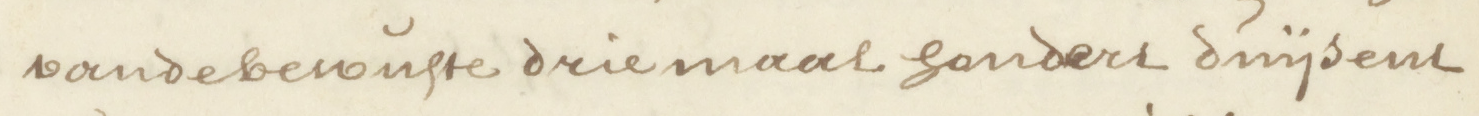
vande bewuste drie maal hondert duijsent
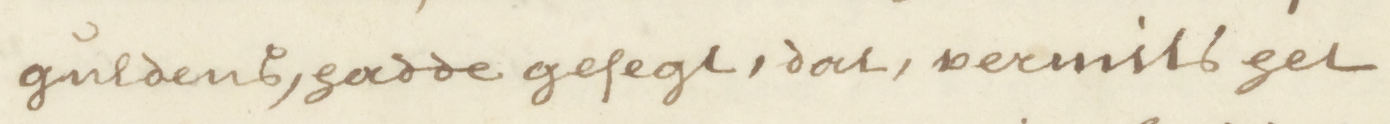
guldens, hadde gesegt, dat, vermits het
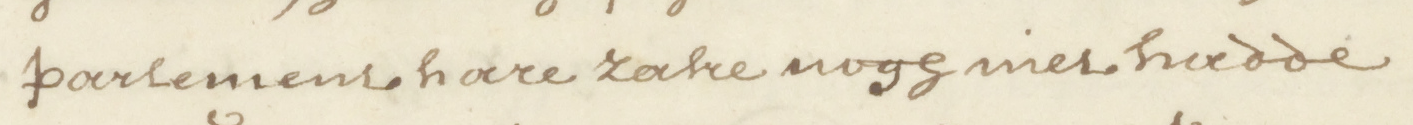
parlement hare zake nogh niet hadde
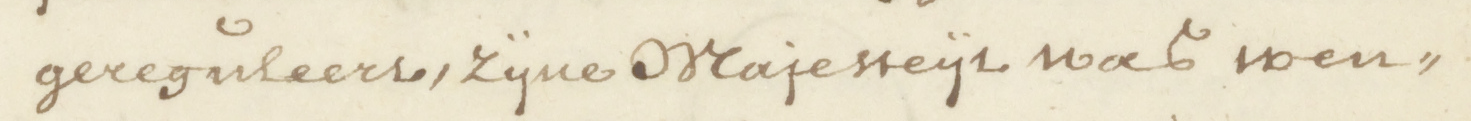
gereguleert, zijne Majesteijt was wen„
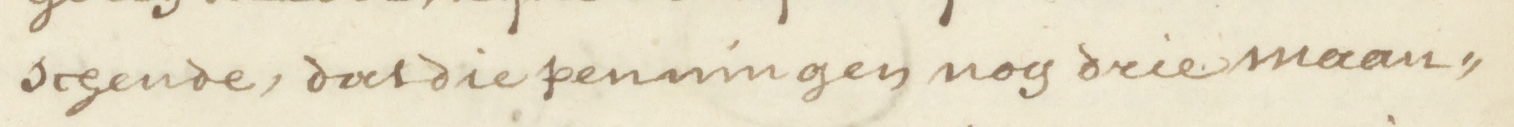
schende, dat die penningen nog drie maan„
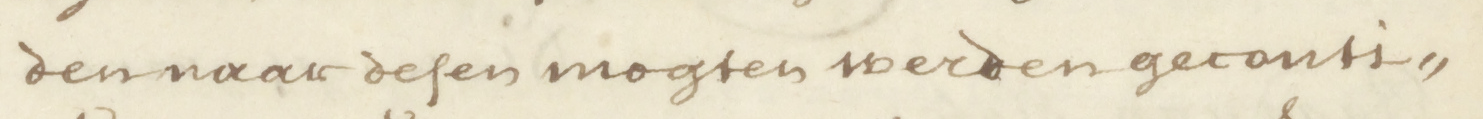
den naar desen mogten werden geconti„
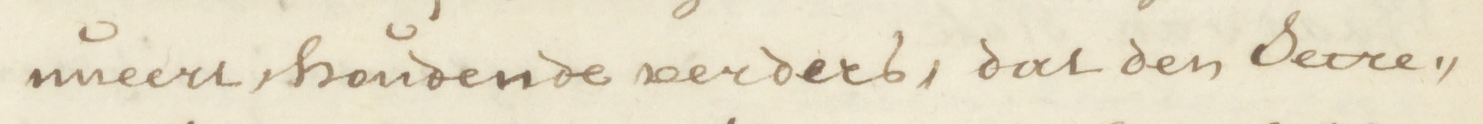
nueert, houdende verders, dat den Secre„
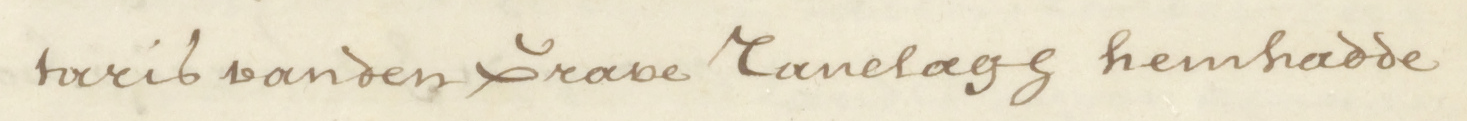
taris vanden Grave Ranelagh hem hadde
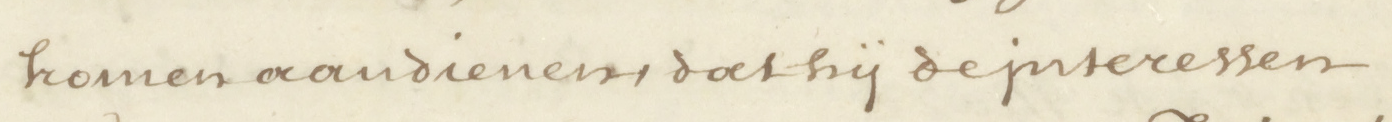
komen aandienen, dat hij de interessen
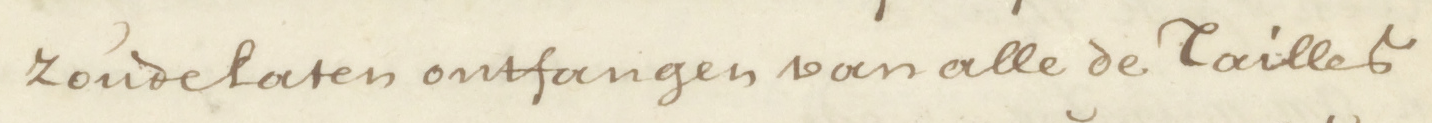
zoude laten ontfangen van alle de Tailles
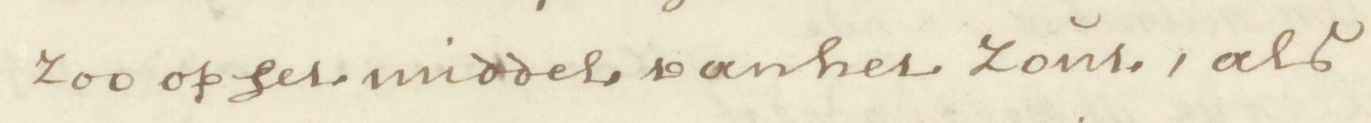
zoo op het middel van het zout, als
